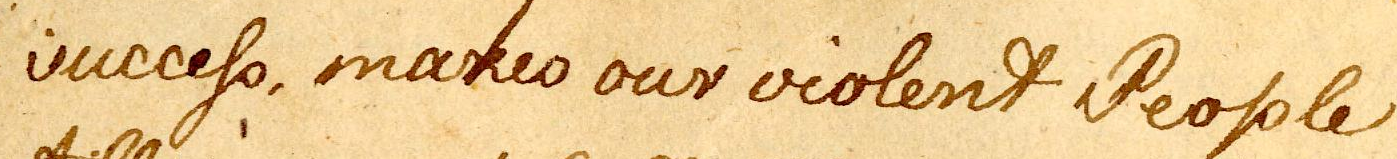success, makes our violent People
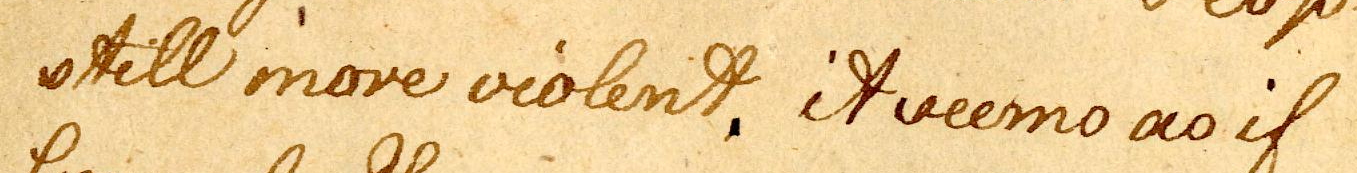still more violent it seems as if
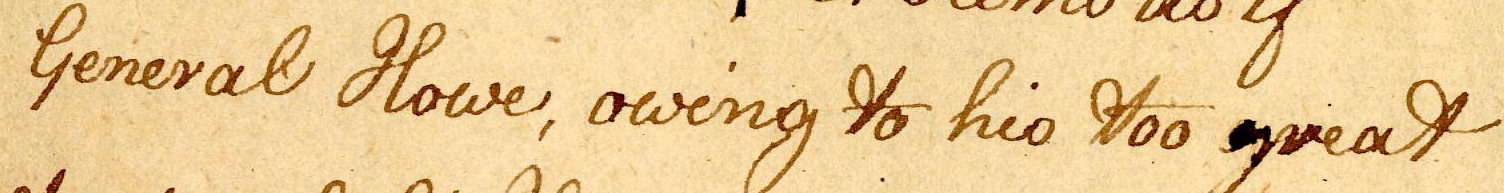General Howe, owing to his too great
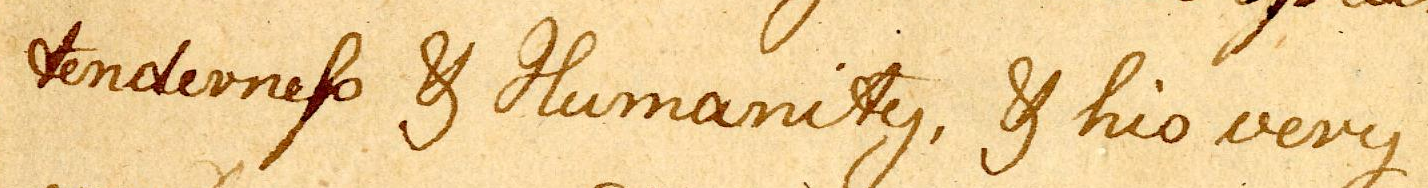tenderness & Humanity, & his very
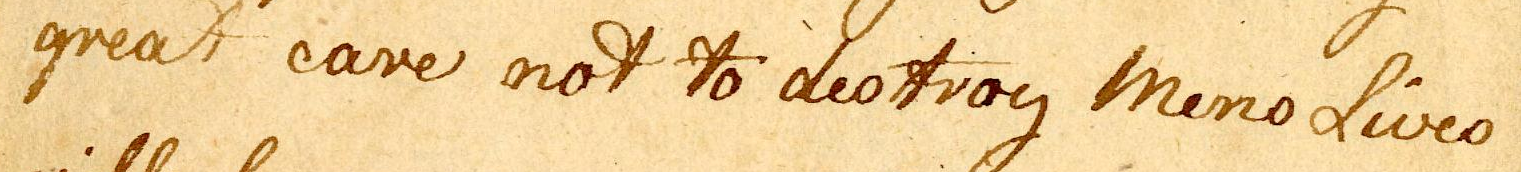great care not to destroy Mens Lives
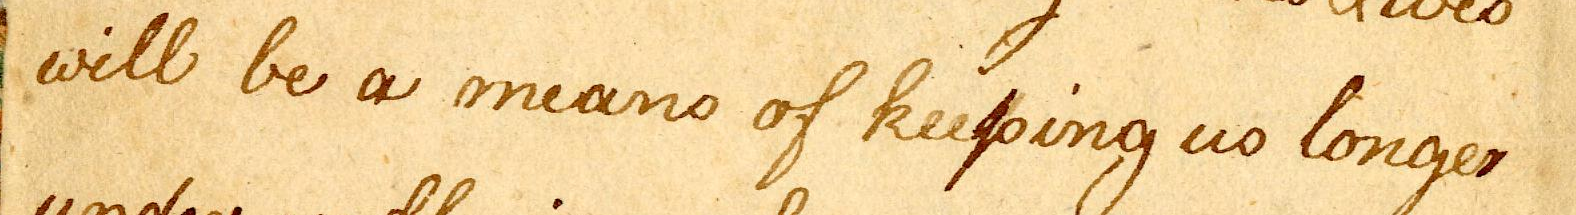will be a means of keeping us longer
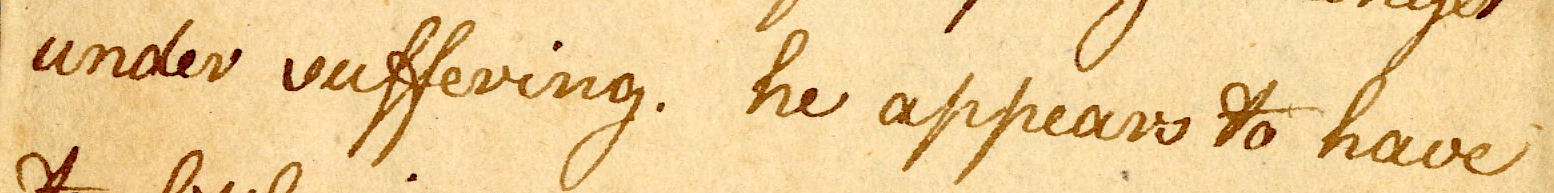under suffering. he appears to have
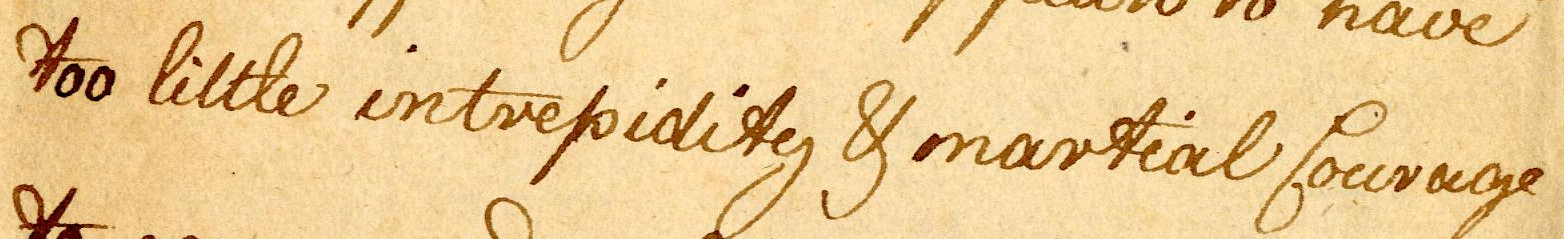too little intrepidity & martial Courage
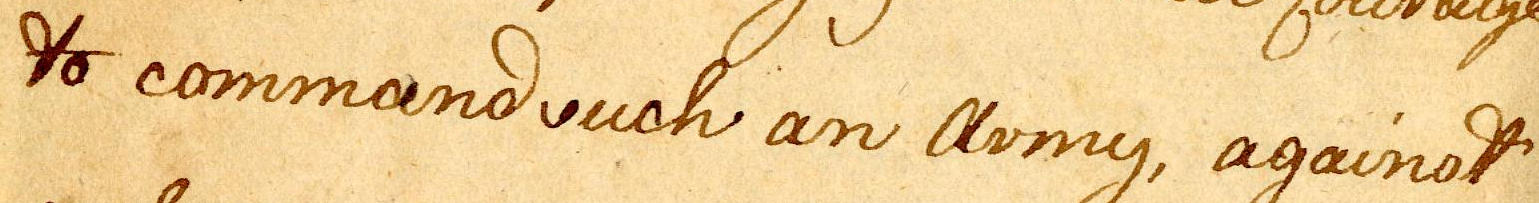to command such an Army, against
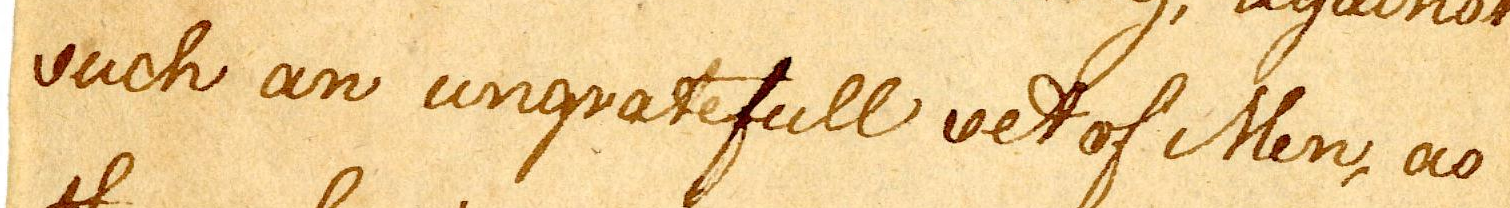such an ungratefull set of Men, as
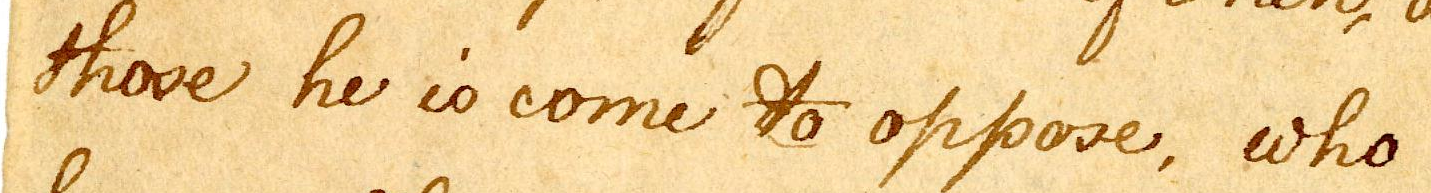those he is come to oppose, who
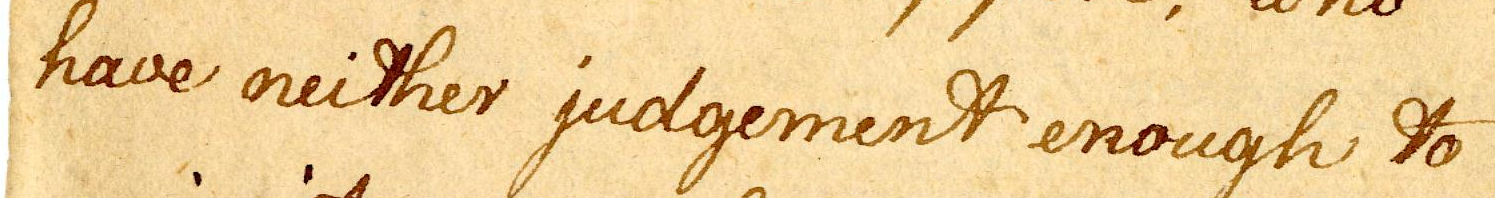have neither judgement enough to
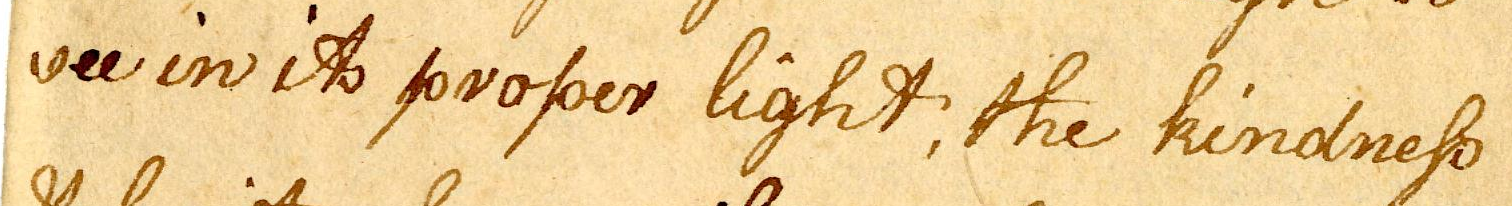see in its proper light, the kindness
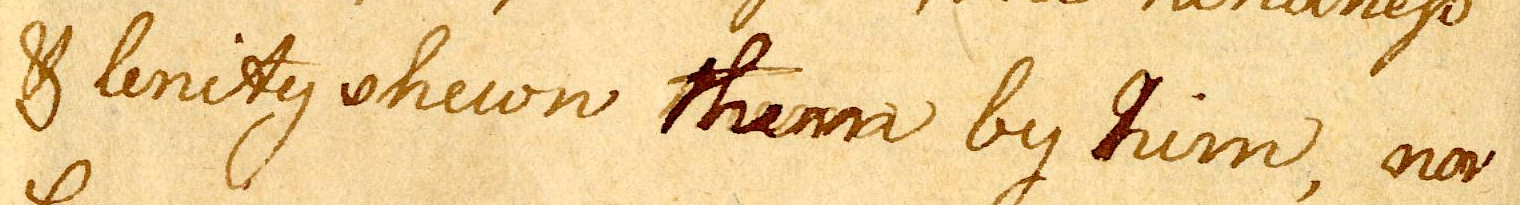& lenity shewn them by him, nor
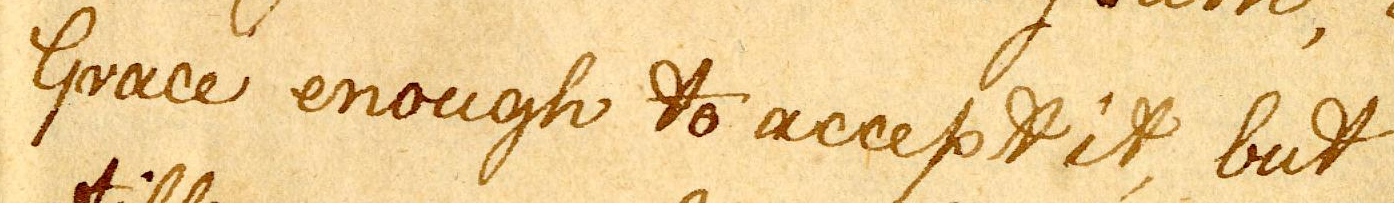Grace enough to accept it, but
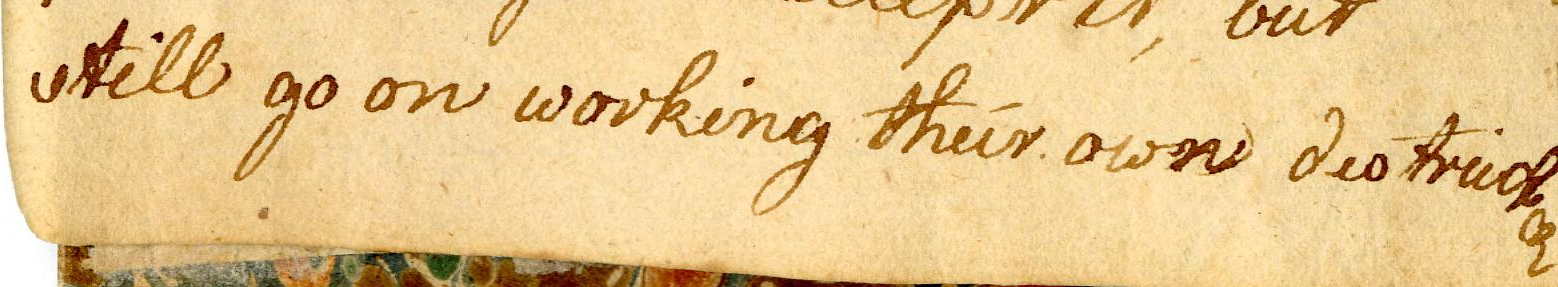still go on working their own destruction
